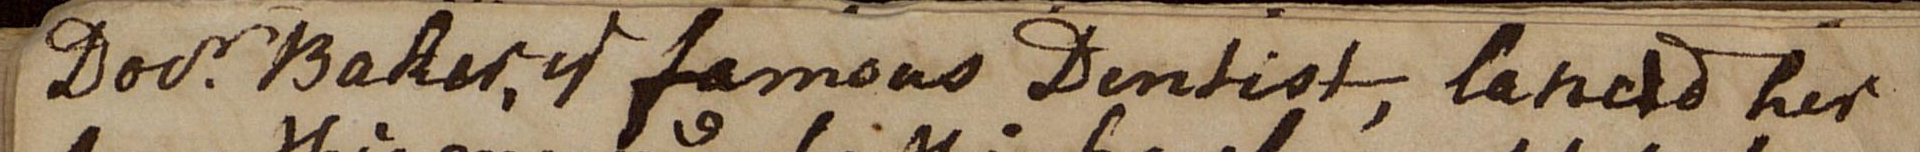Doc^r. Baker, y^e famous Dentist, lancd her
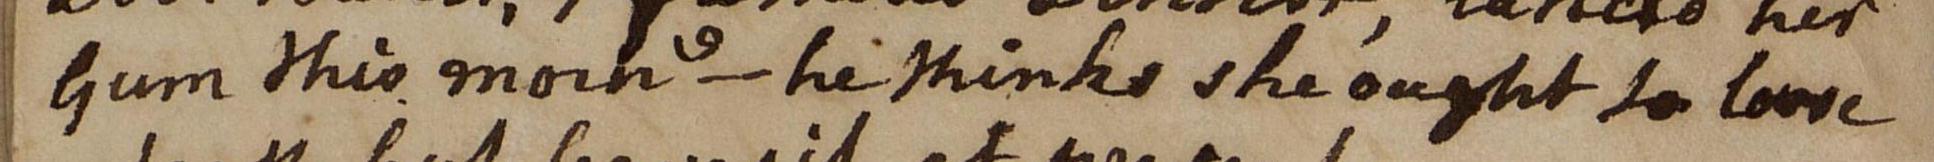Gum this morn^g- he thinks she ought to loose
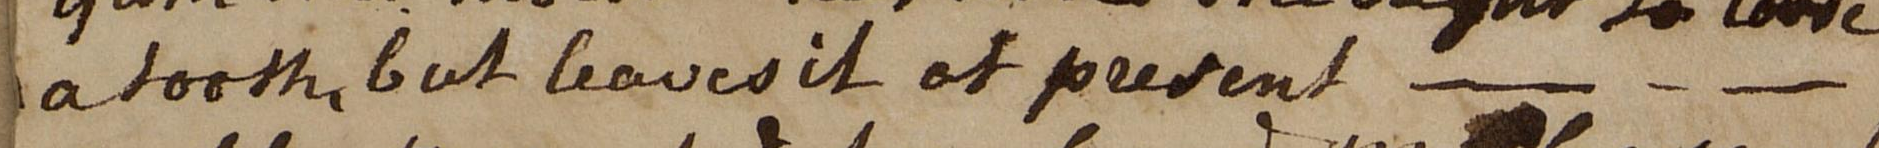a tooth, but leaves it at present---
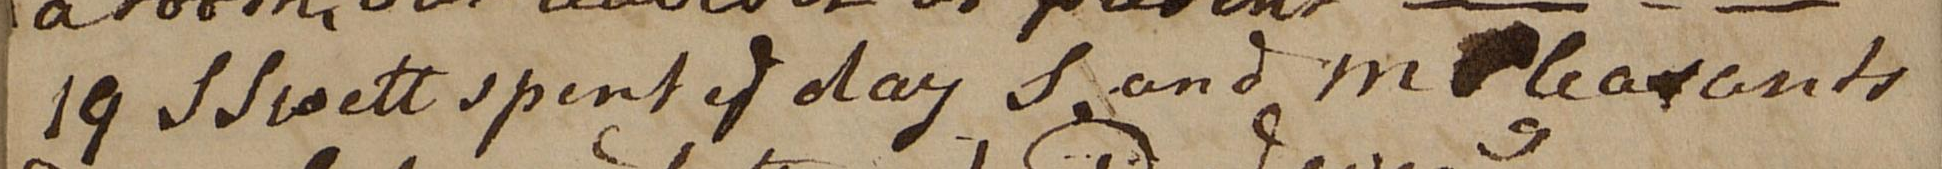19 S Swett spent y^e day S, and M Pleasants
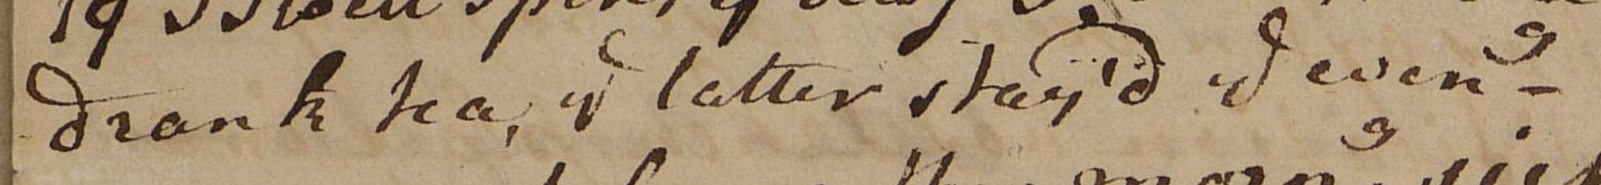drank tea, y^e latter stay'd y^e even^g-
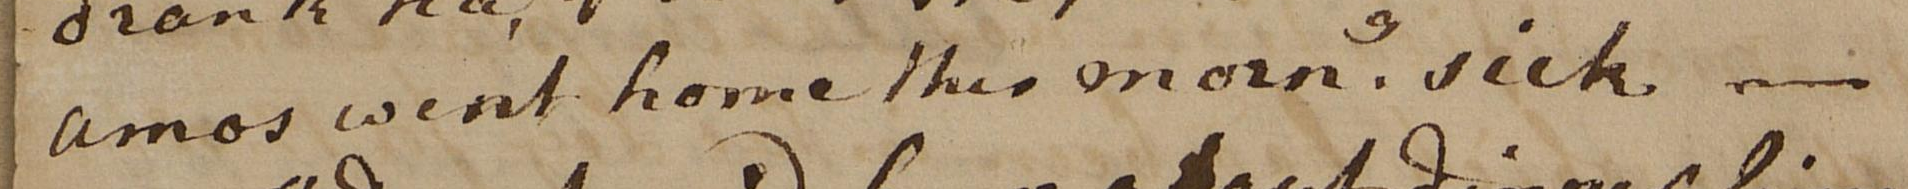amos went home this morn^g. sick.-
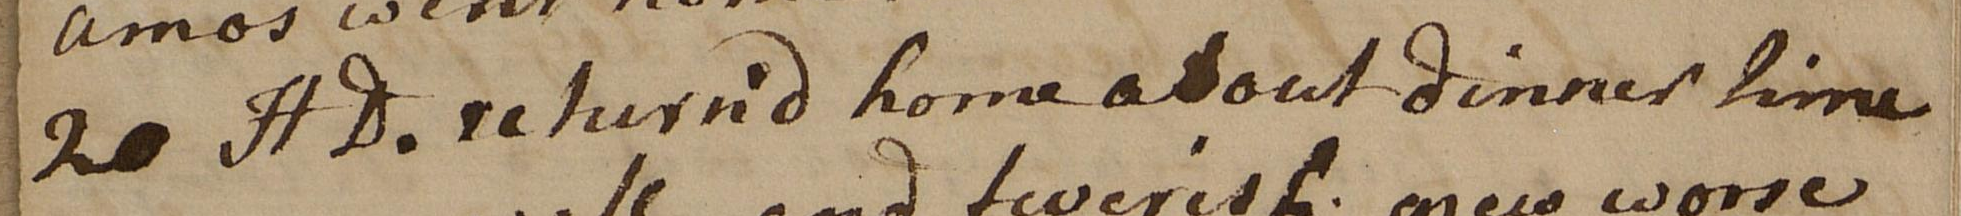20 HD. return'd home about dinner time
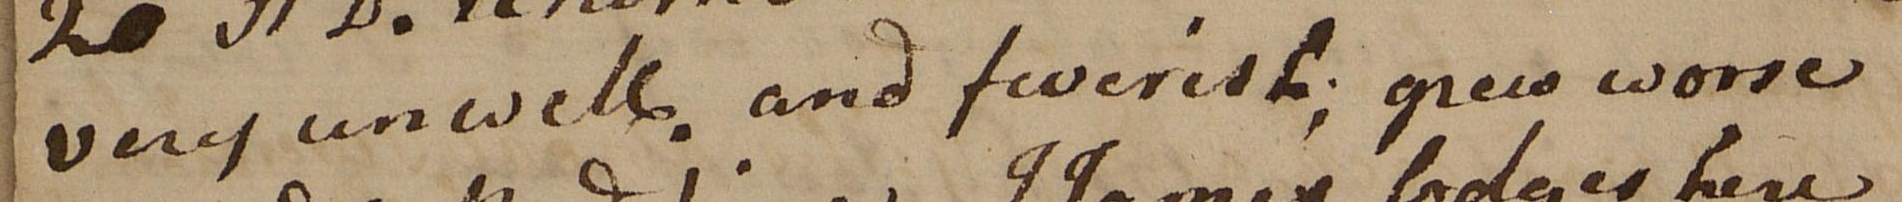very unwell, and feverish; grew worse
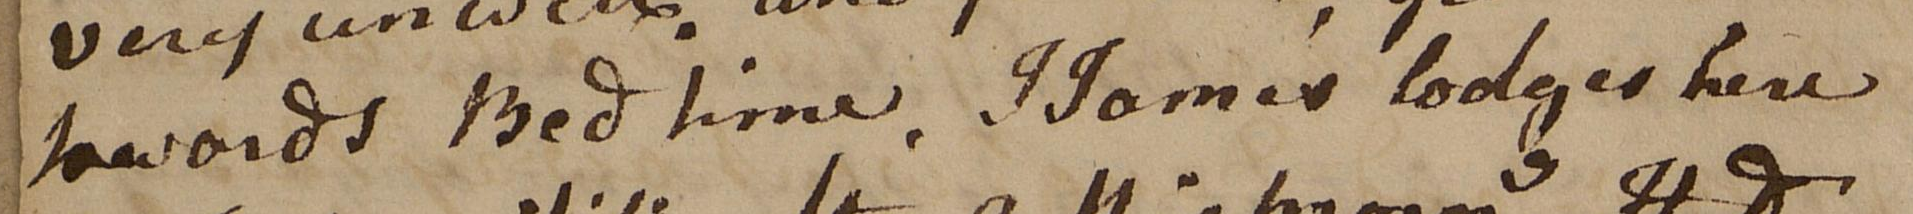towards Bed time, I James lodges here
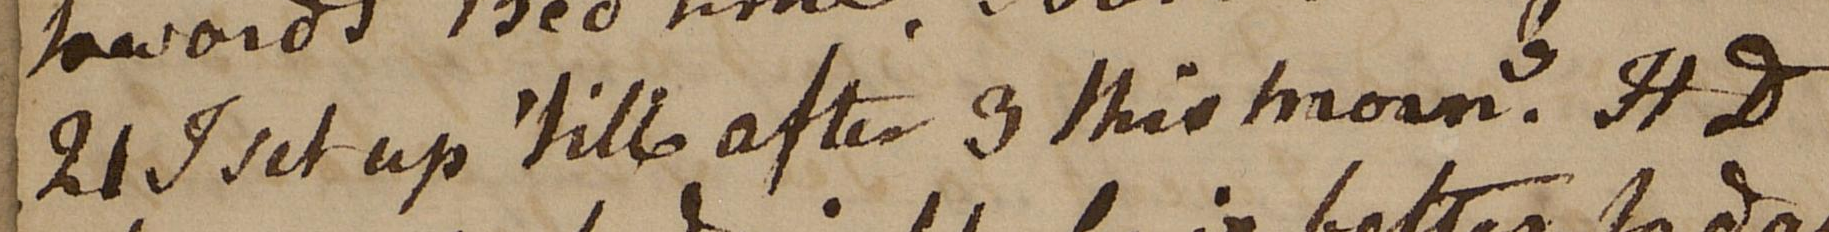21 I set up 'till after 3 this morn.^g HD
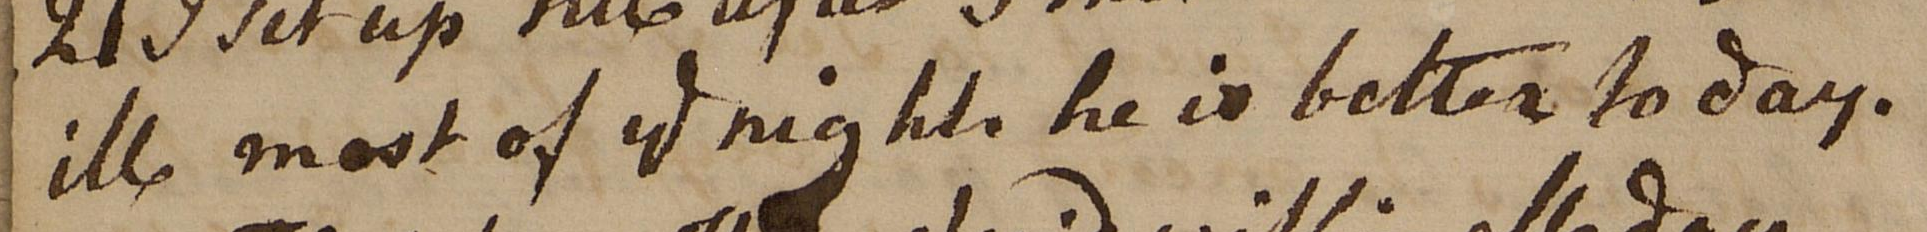ill most of y^e nights he is better to day.
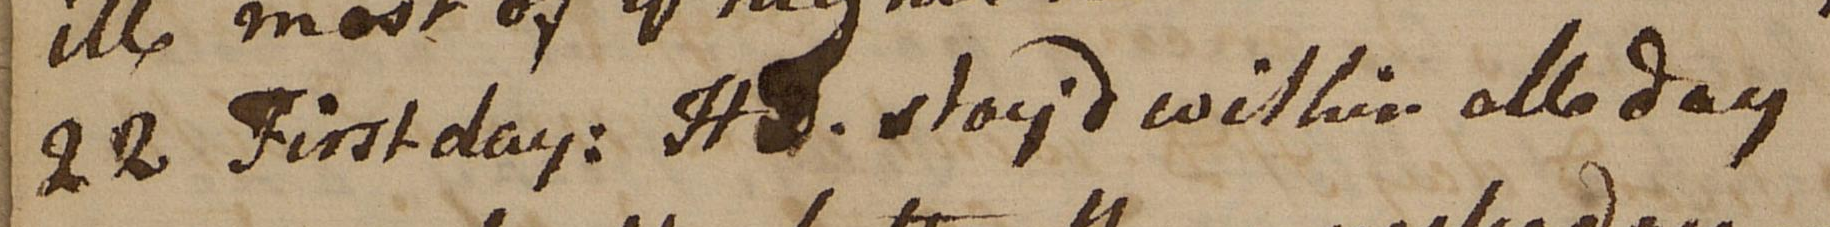22 First day: HD. stay'd within all day
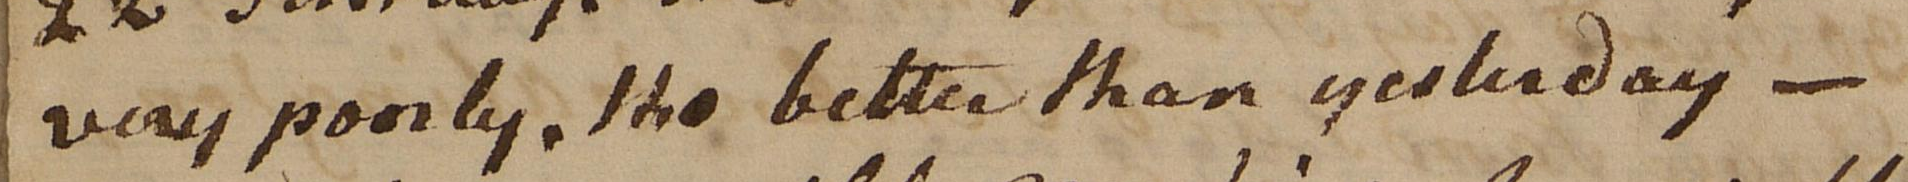very poorly, tho better than yesterday-
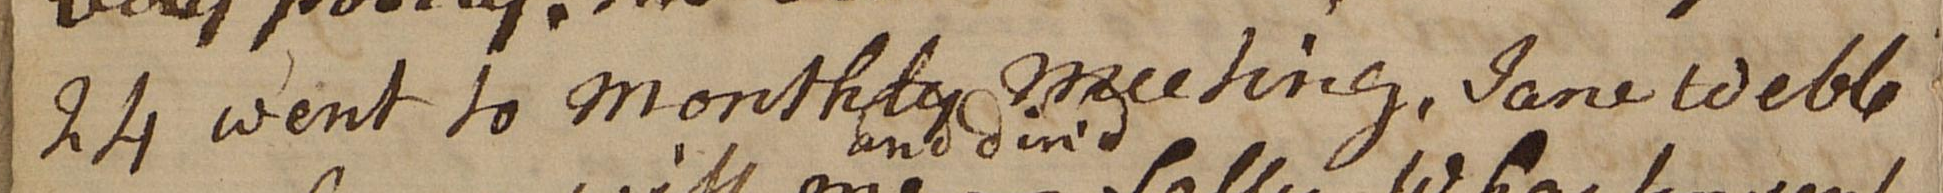24 went to monthly meeting, Jane Webb
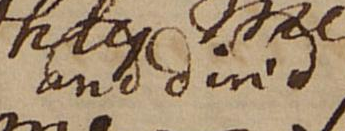and din'd
